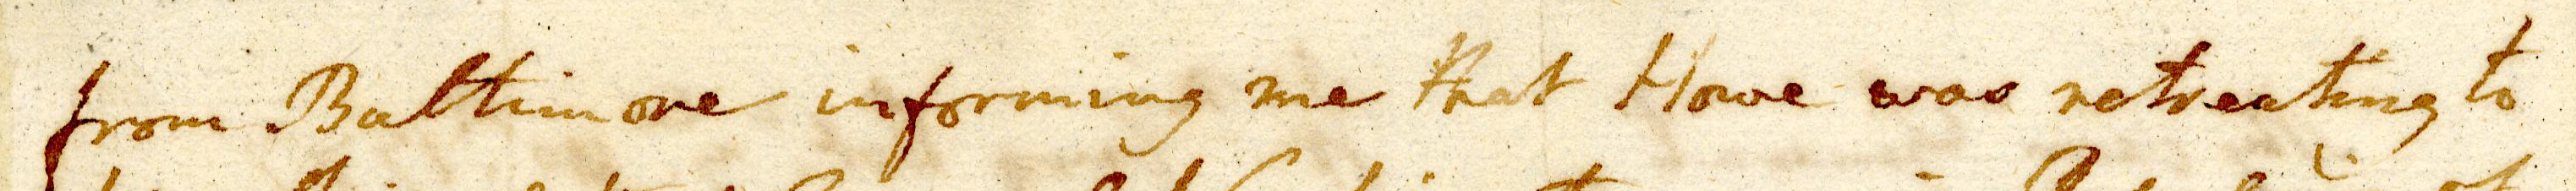from Baltimore informing me that Howe was retreating to
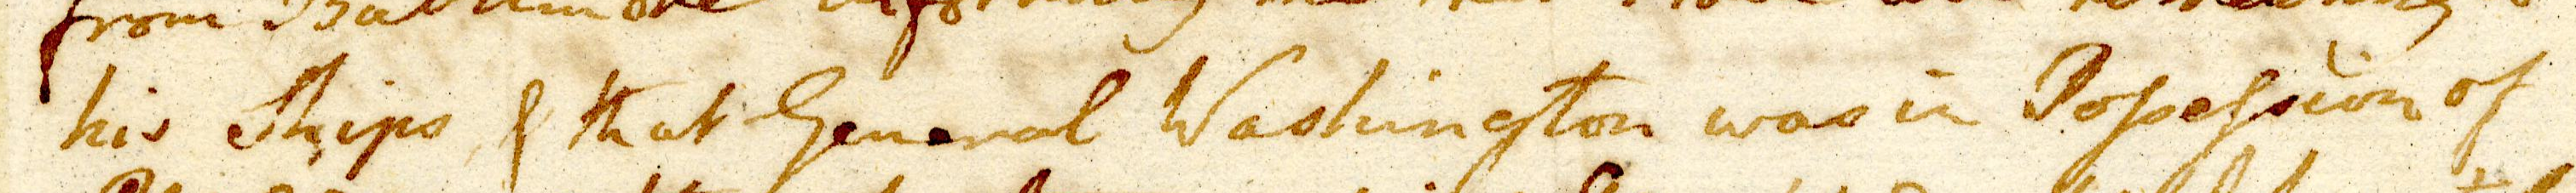his Ships & that General Washington was in Possession of
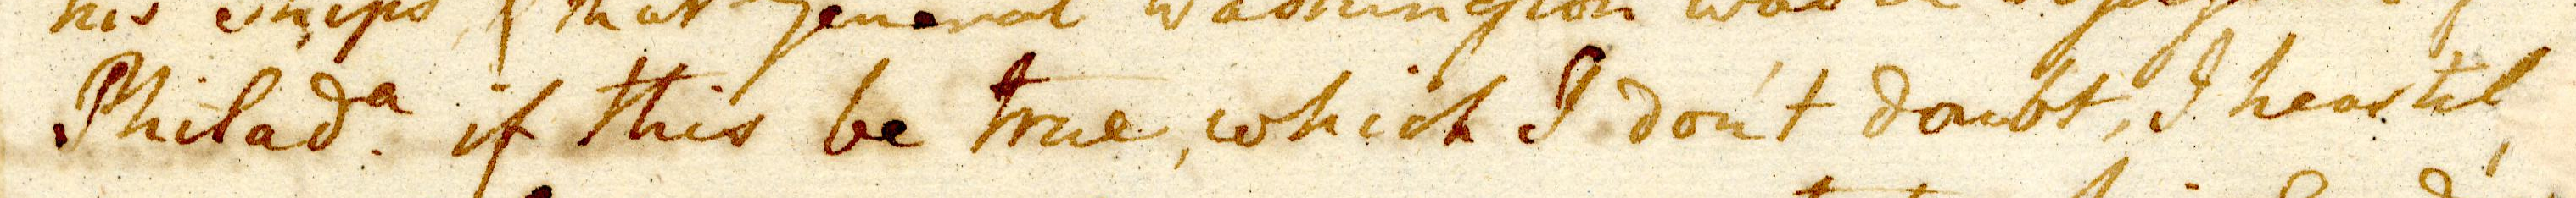Philad^a. if this be true, which I don't doubt, I heartily
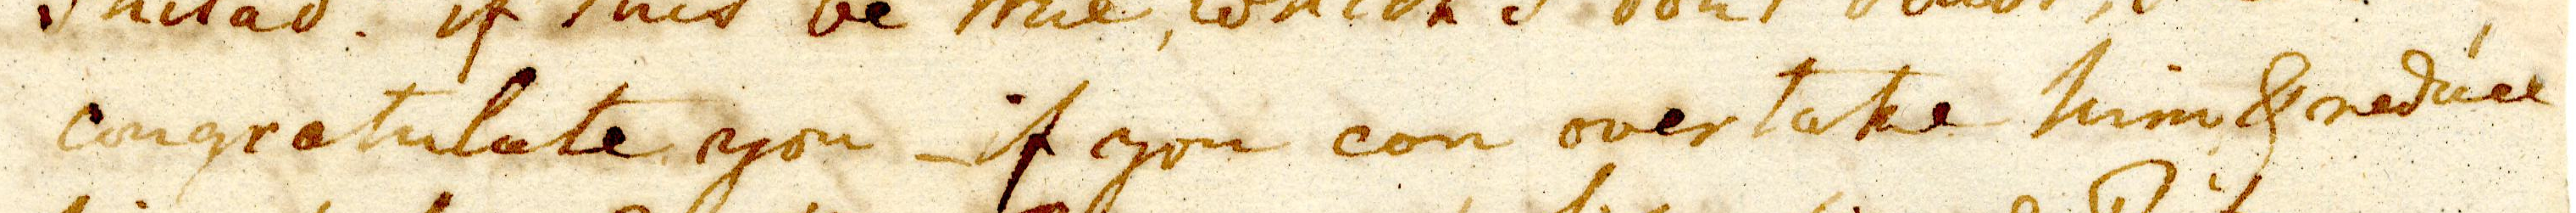congratulate you- if you can overtake him & reduce
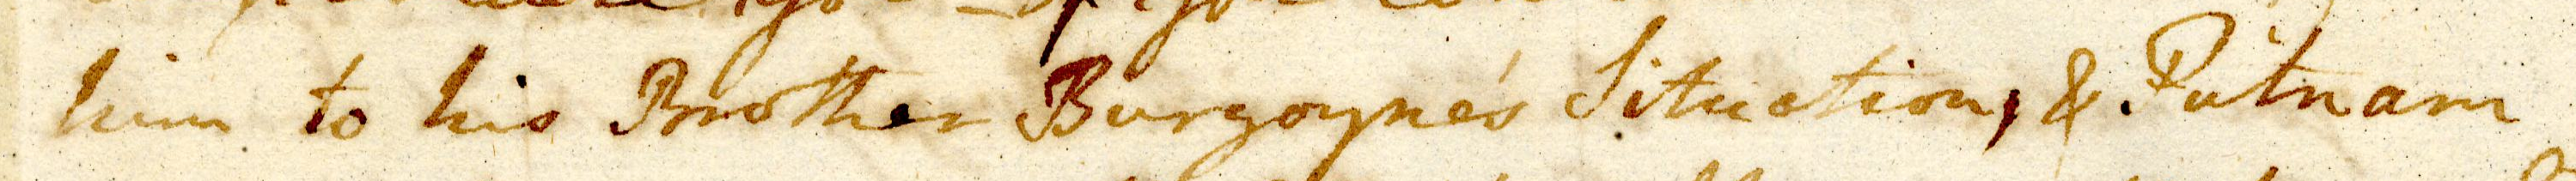him to his Brother Burgoyne's Situation, & Putnam
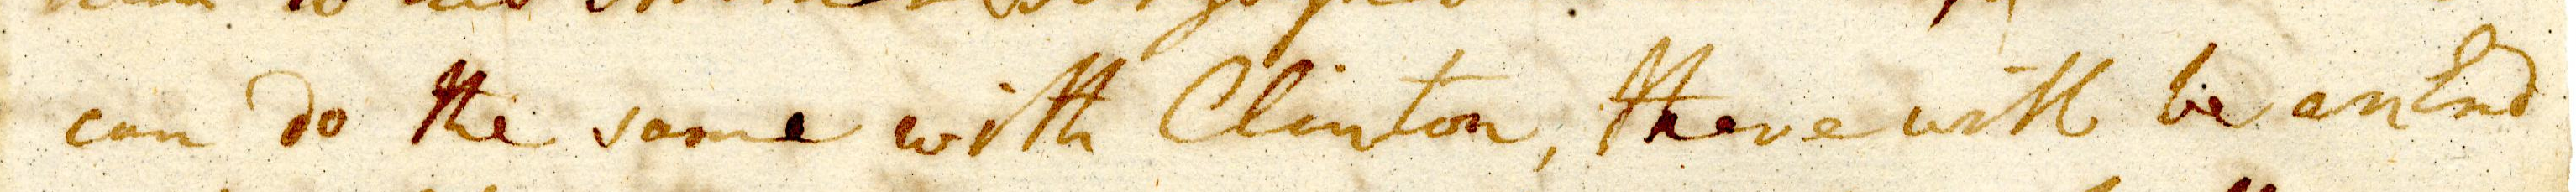can do the same with Clinton, there will be an End
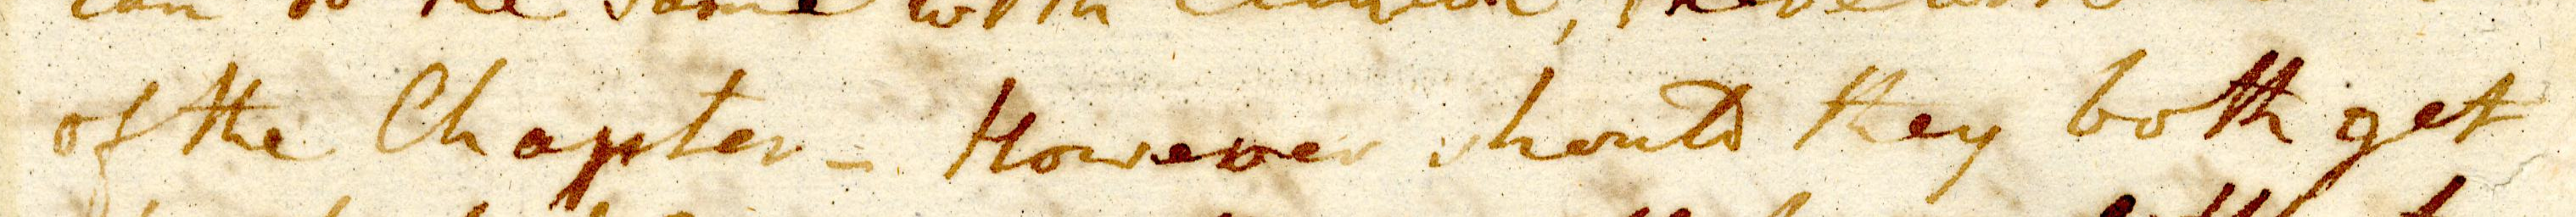of the Chapter- However should they both get
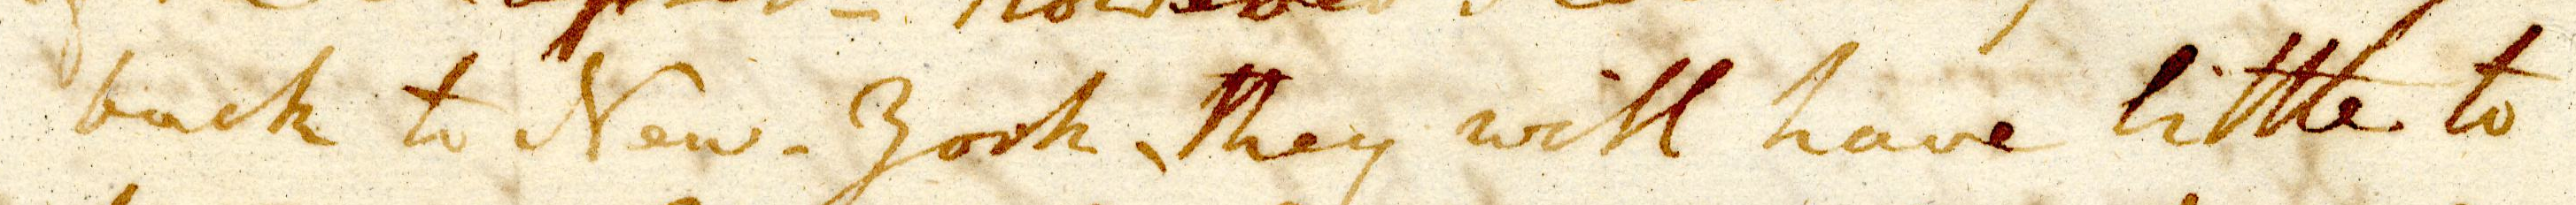back to New-York, they will have little to
